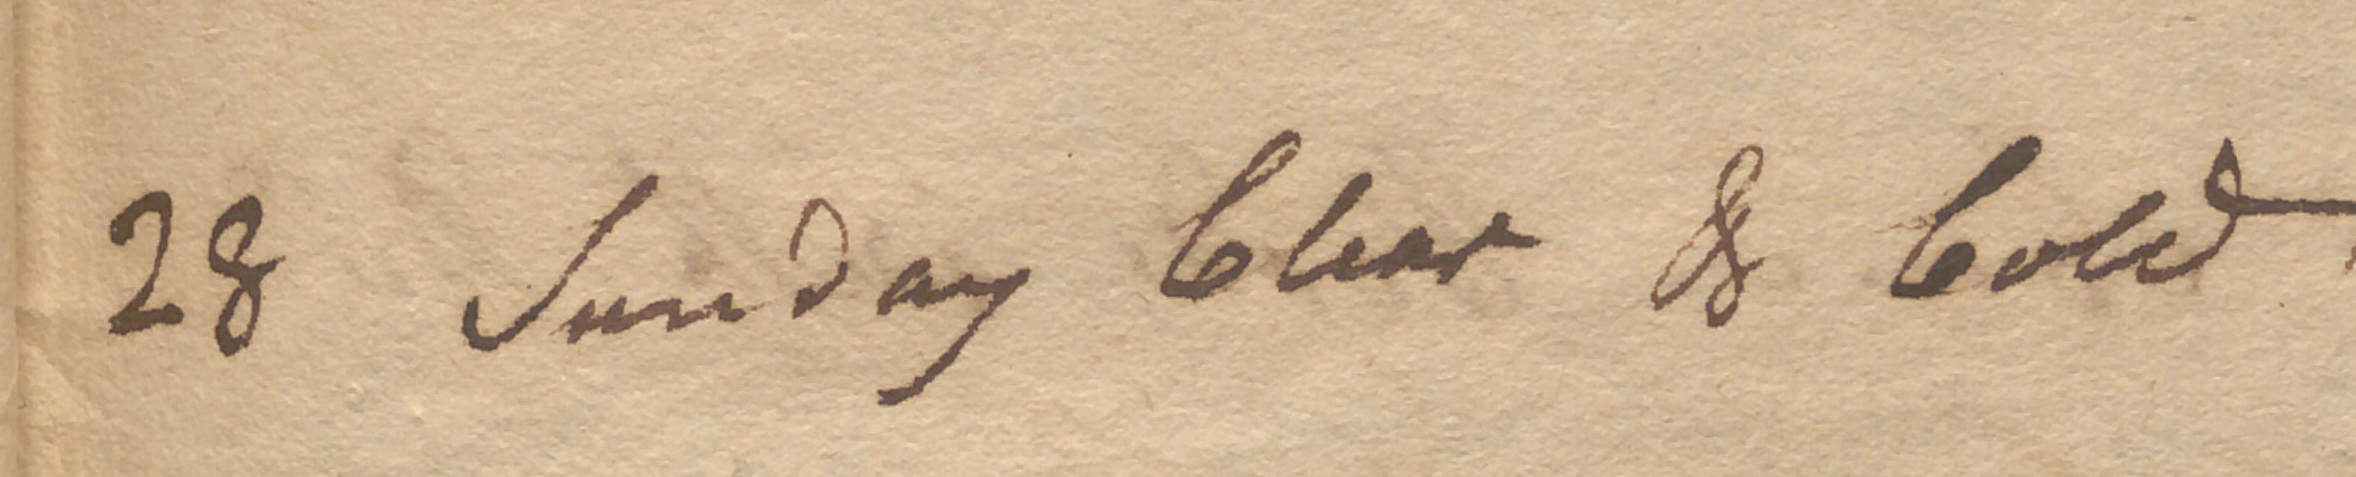28 Sunday Clear & Cold
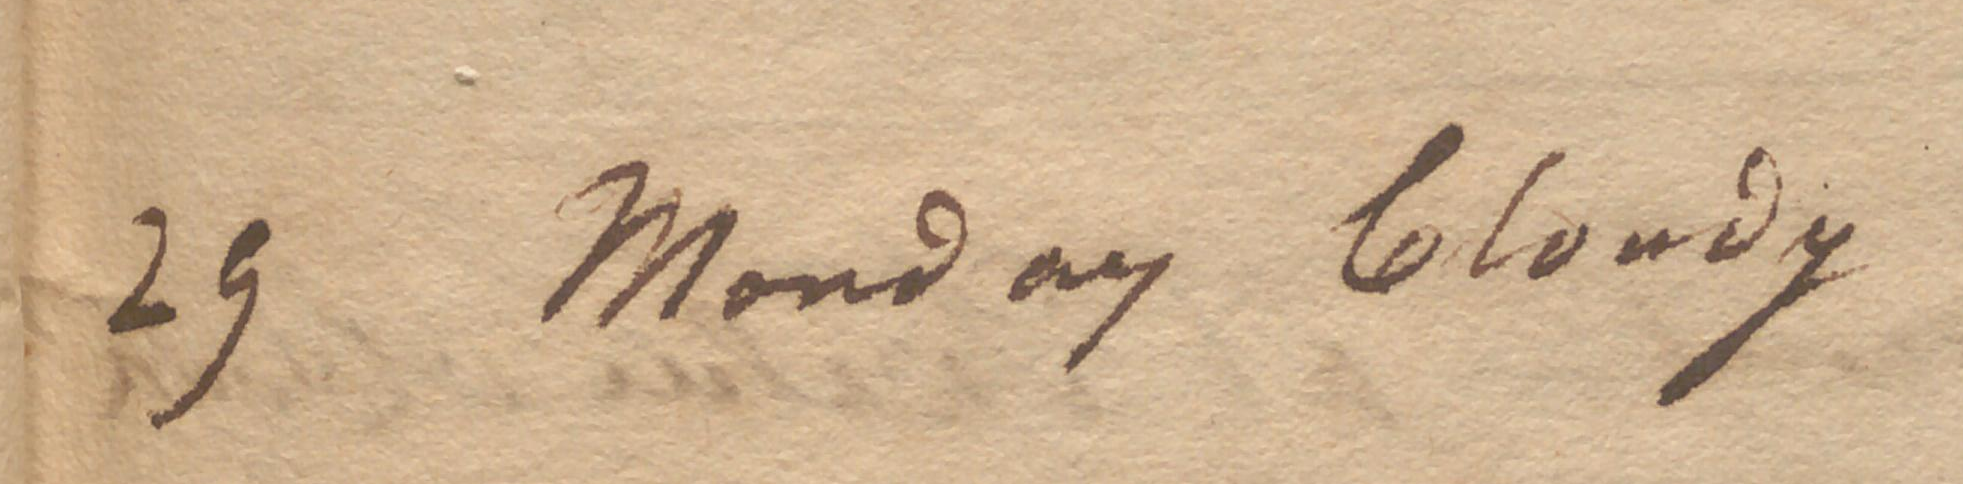29 Monday Cloudy
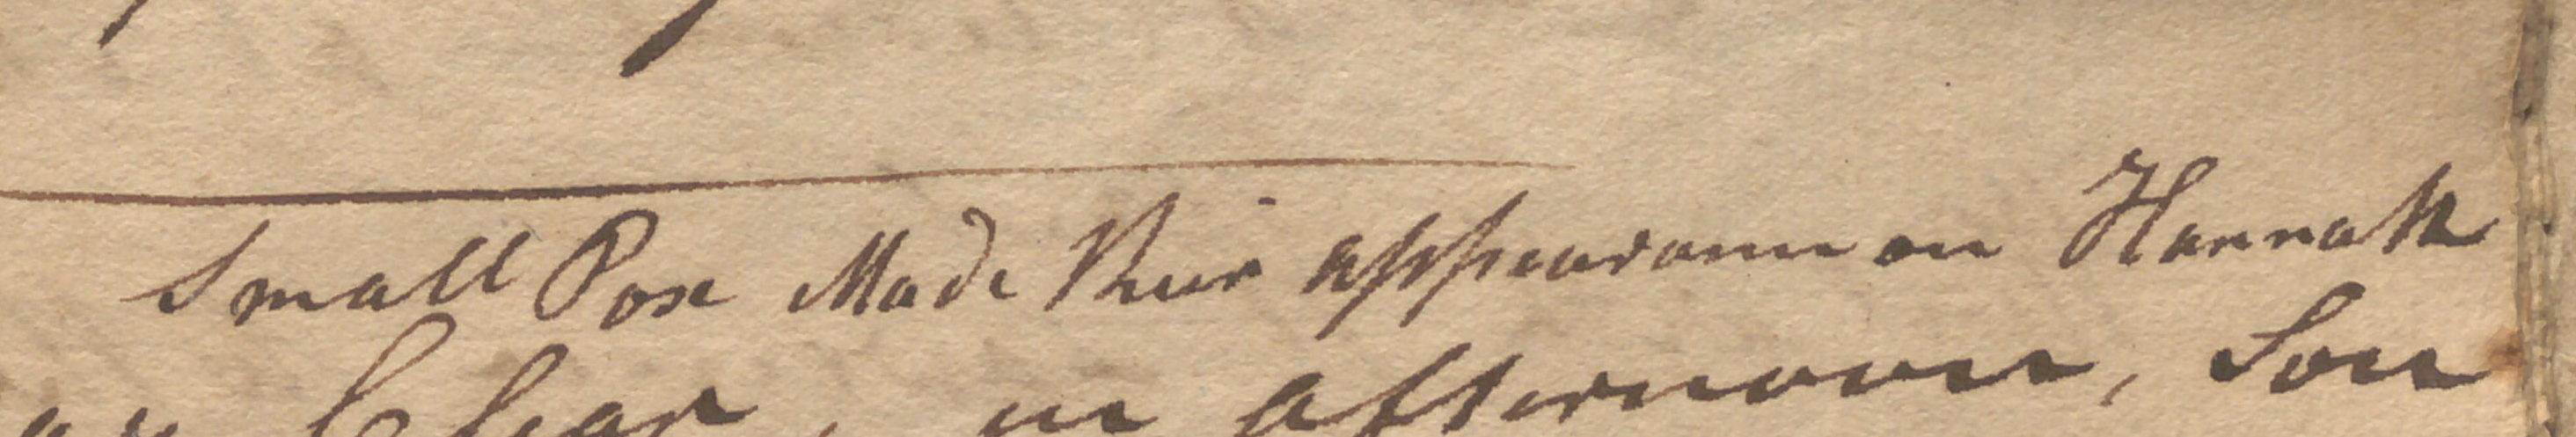Small Pox Made their appearance on Hannah
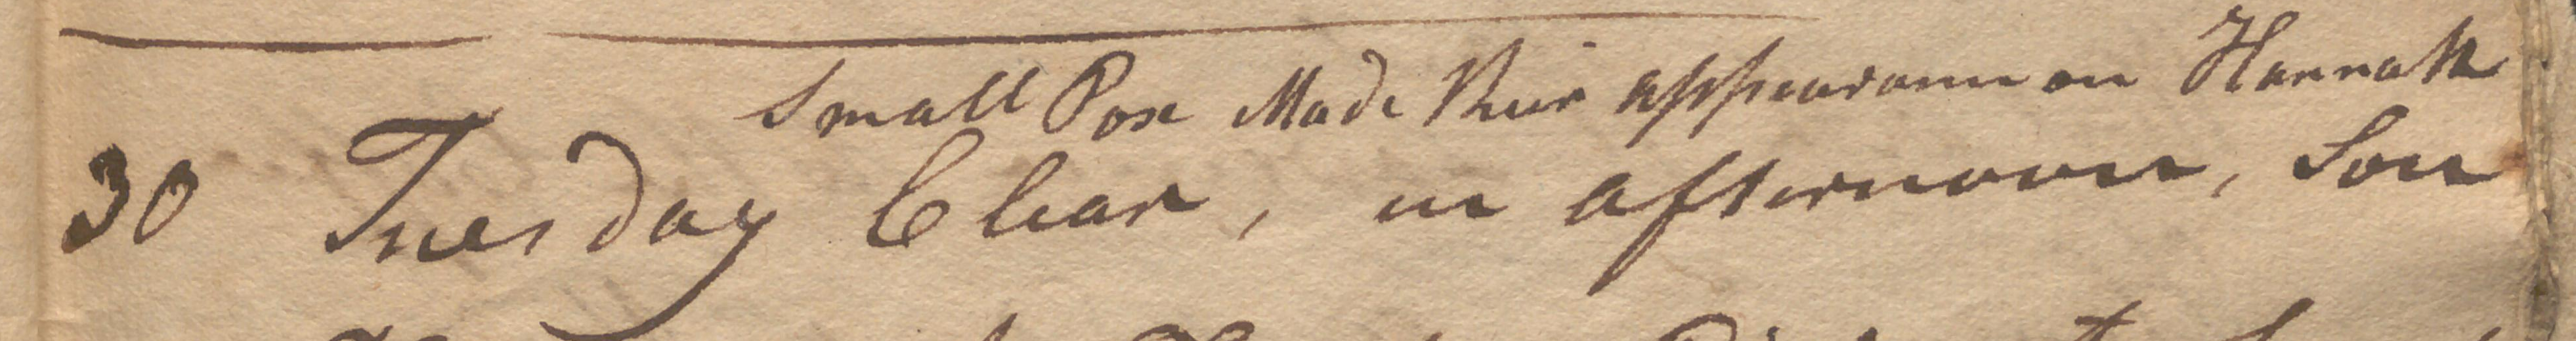30 Tuesday Clear, in afternoon, Son
